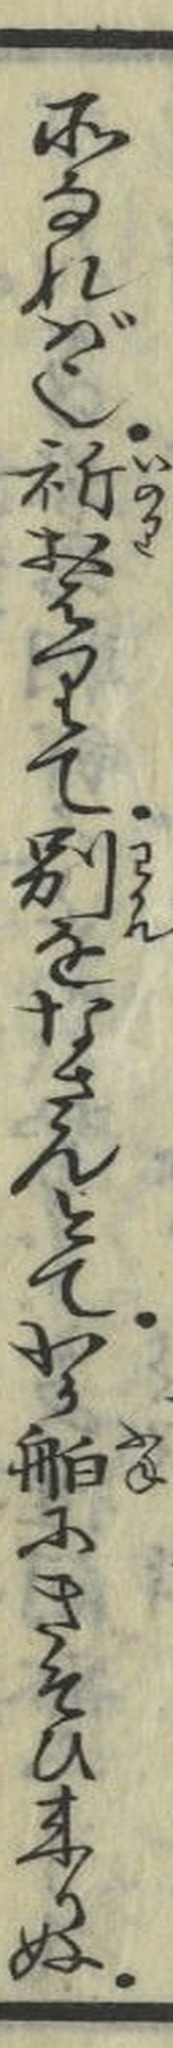所なれば也・祈おはりて・別をなさんとて・登舶(ふね)にきそひ来りぬ・
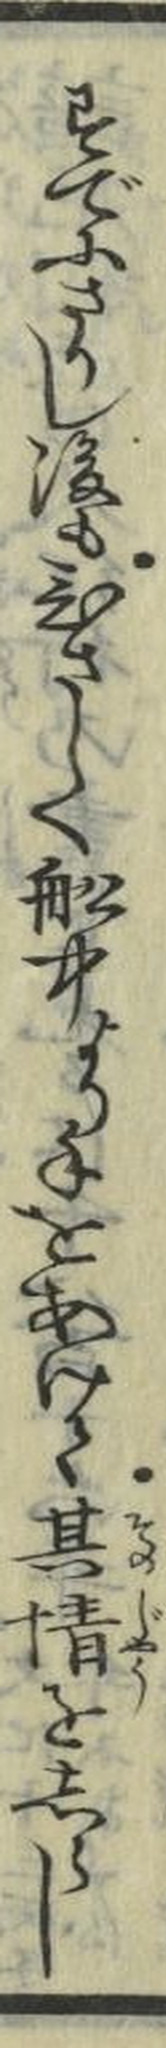すでにさりし後も・ひさしく船中より手をあけて・其情をしらし
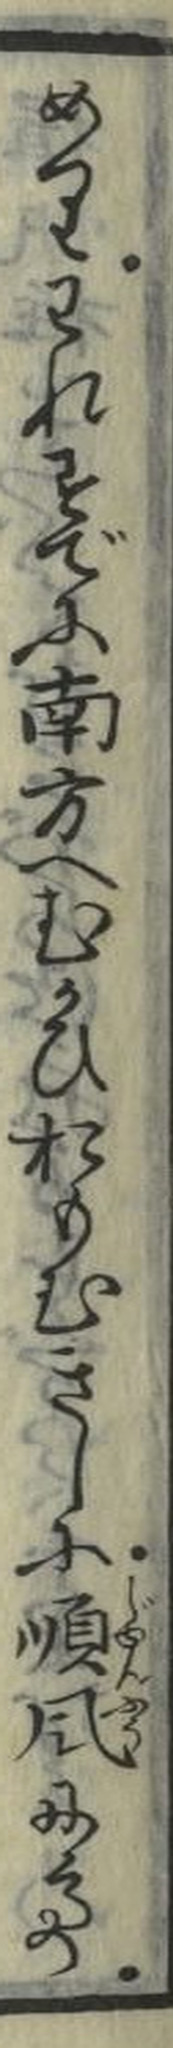めり・われすでに南方へむかひおもむきしに・順風にて・
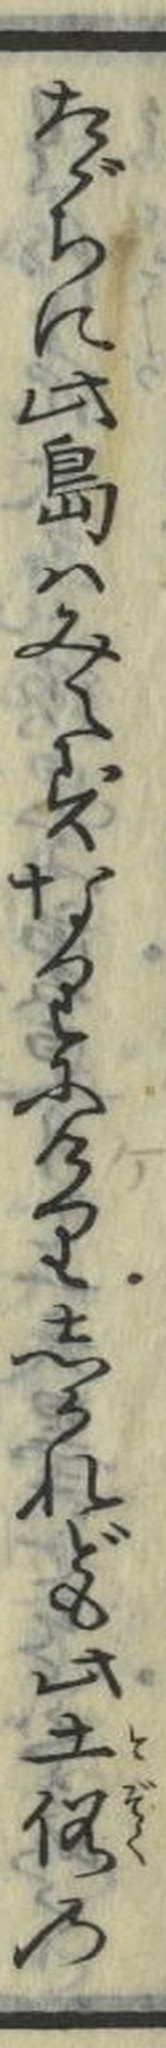たゞちに此島はみえずなりにけり・しかれども此土俗の
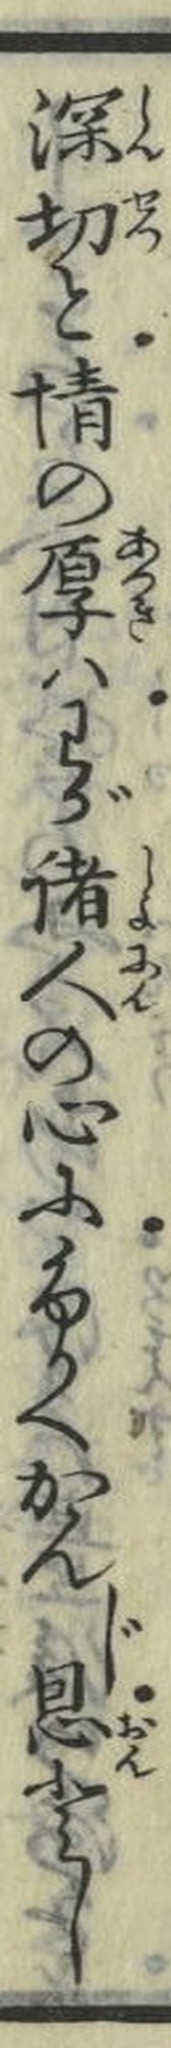深切と・情の厚は・わが諸人の心に・ふかくかんじ・恩とし
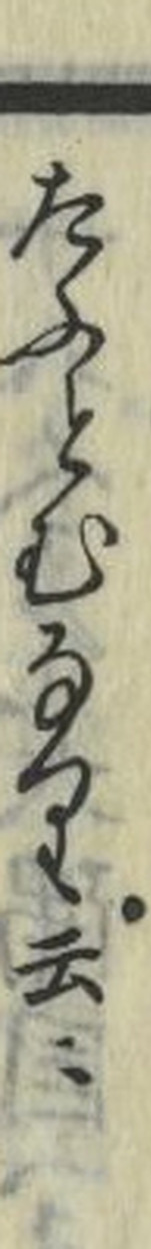たふとむなり・云々
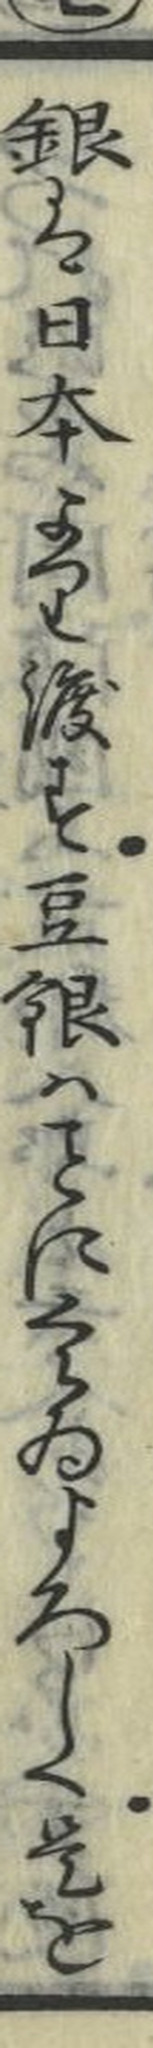銀は日本より渡す・豆銀はことにくらゐよろしく・是を
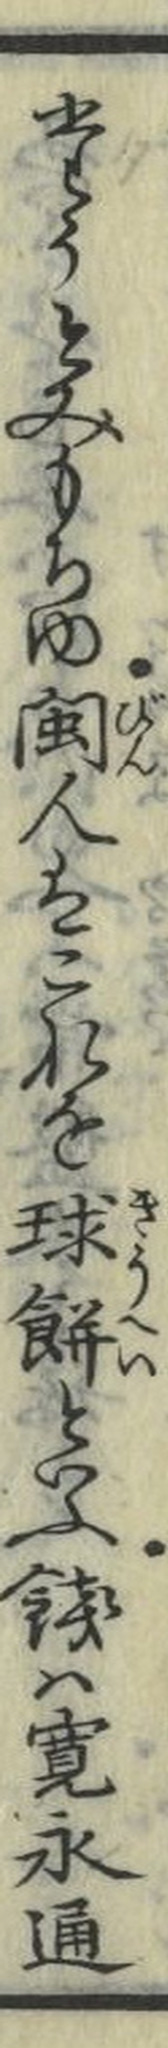たうとみもちゆ・閩人はこれを球餅といふ・銭は寛永通
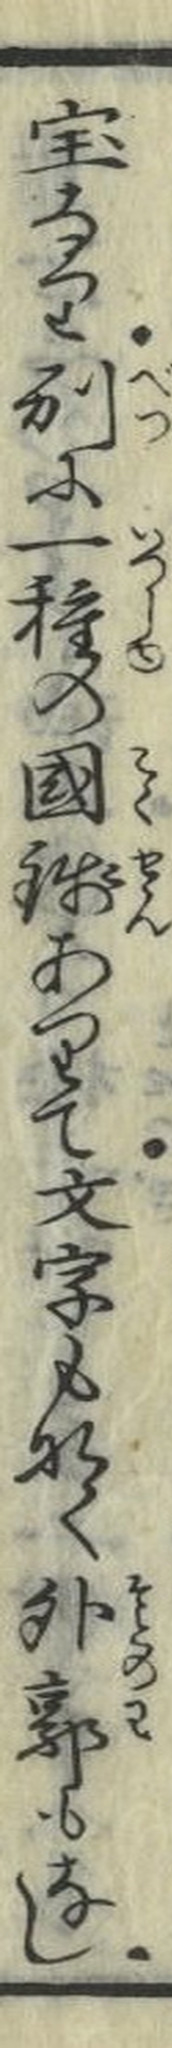宝なり・別に一種の國銭ありて・文字もなく外郭もなし・
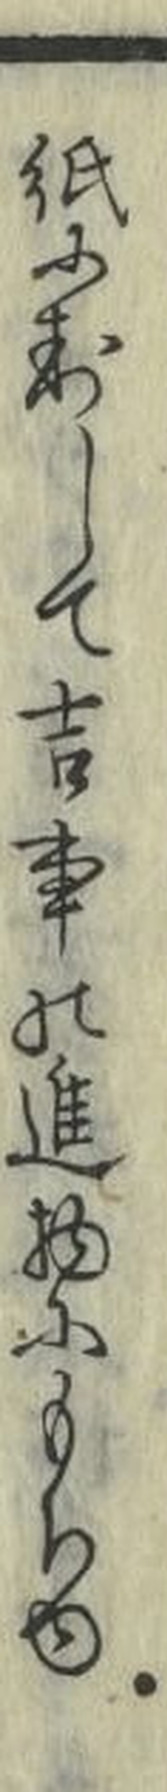紙に刺して吉事の進物にもちゆ・
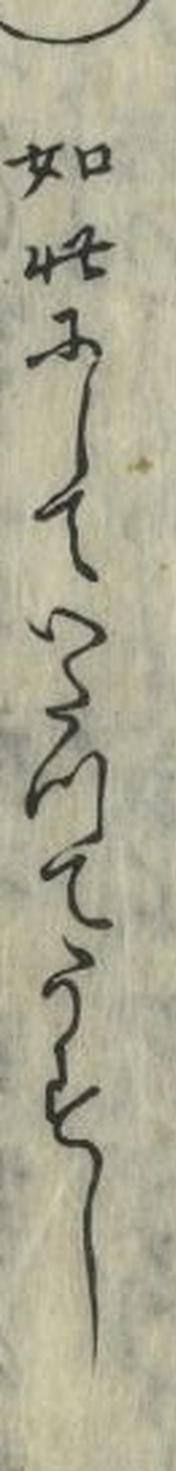如此にしていたつてうすし

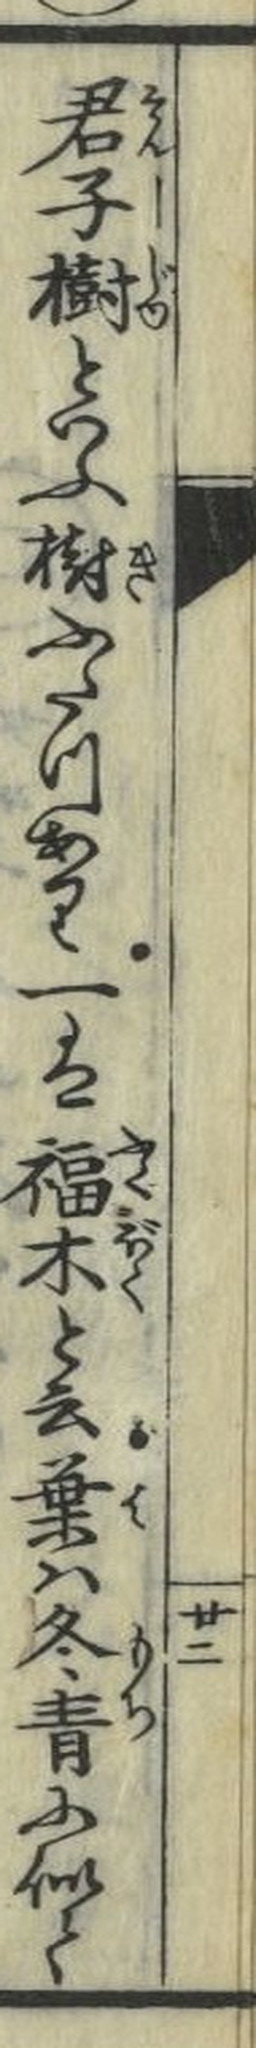君子樹といふ樹ふたつあり・一は福木と云・葉は冬青に似て
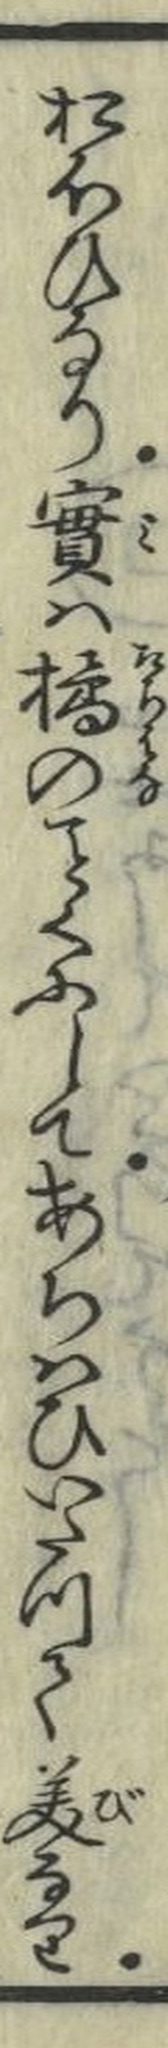おほひなり・實は橘のことくにして・あちはひいたつて美なり・
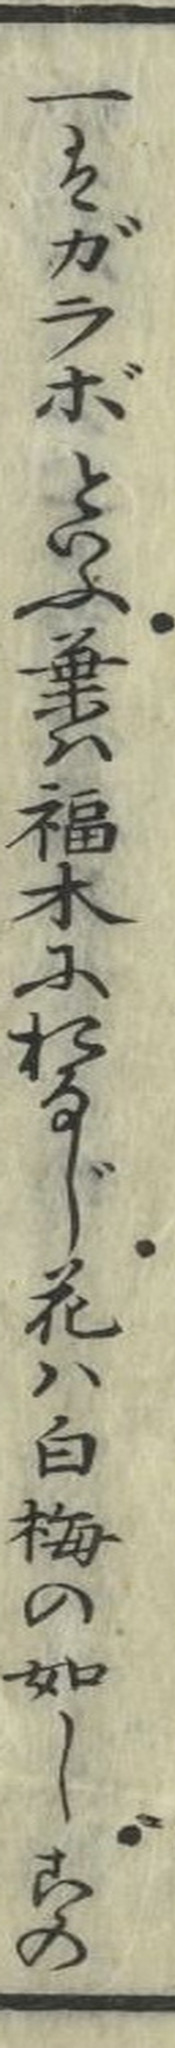一はガラボといふ・葉は福木におなじ・花は白梅の如し・この
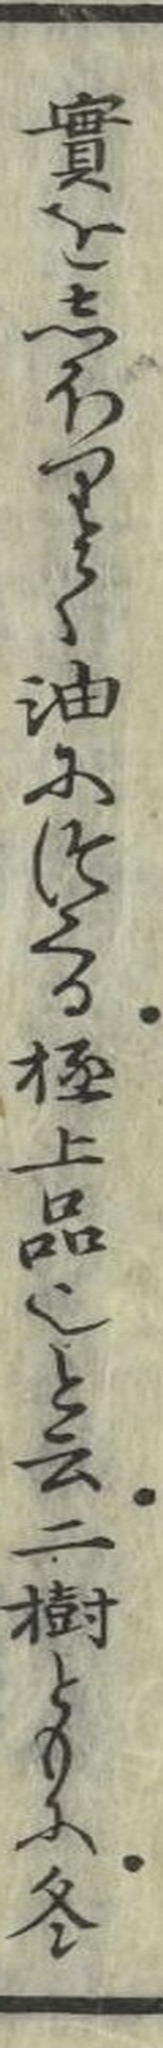實をしほりて油につくる・極上品也と云・二樹ともに・冬
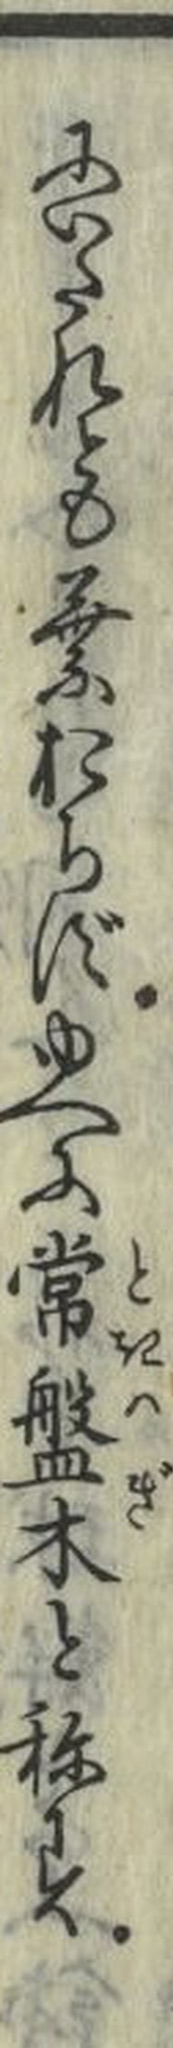にいたれとも葉おちず・ゆへに常盤木と称す・
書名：琉球秊代記 附雑話 全
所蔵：University of the Ryukyus Library
